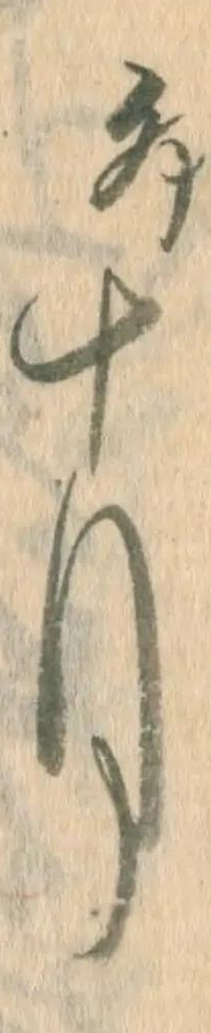卯十月
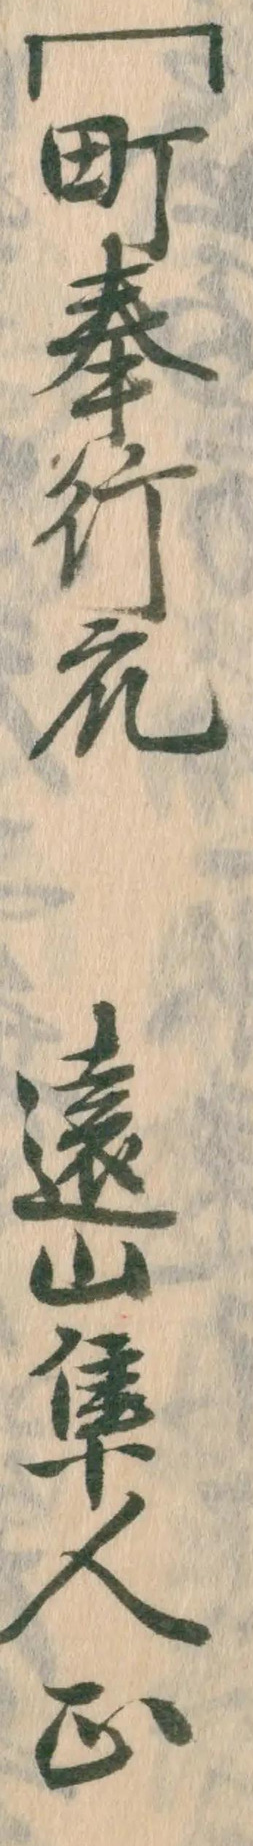│[町奉行衆遠山隼人正
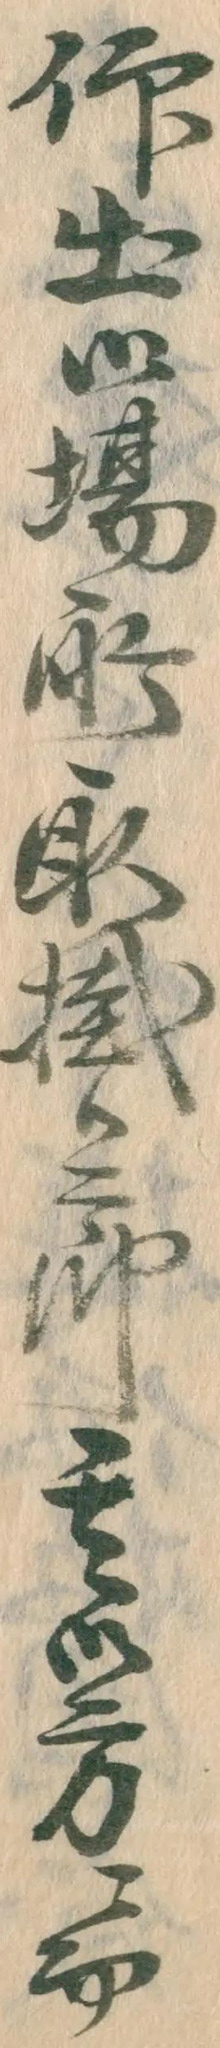仰出候場所取掛候節其御方ニて

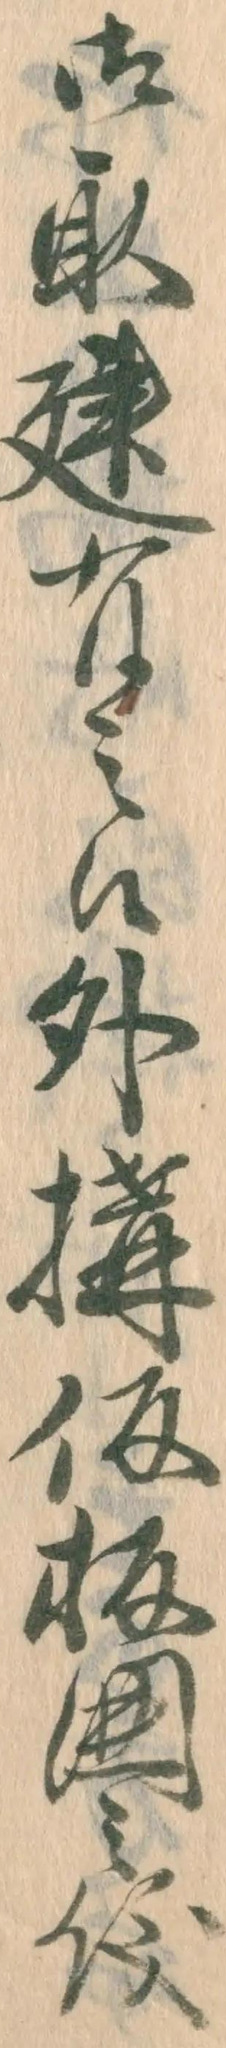御取建有之候外構仮板囲之儀
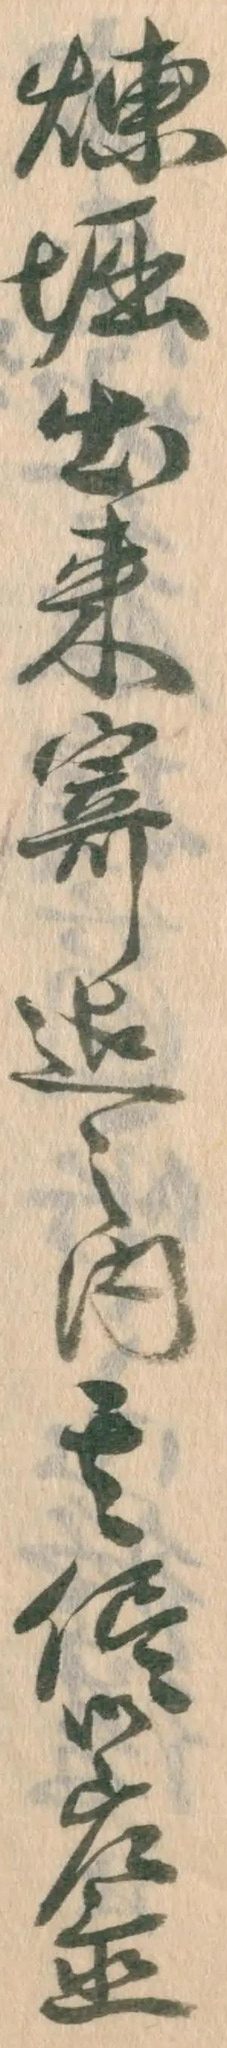煉塀出来寄迄之内其儘御差置
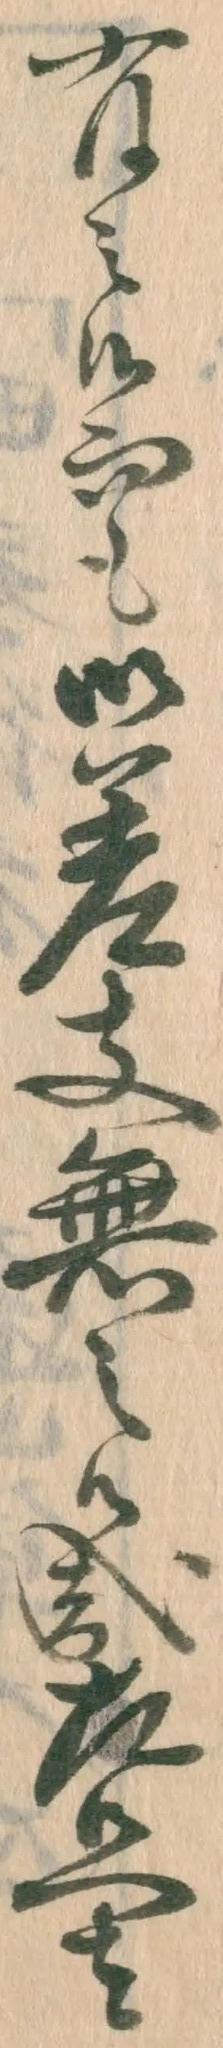有之候ても御差支無之候哉左候へは
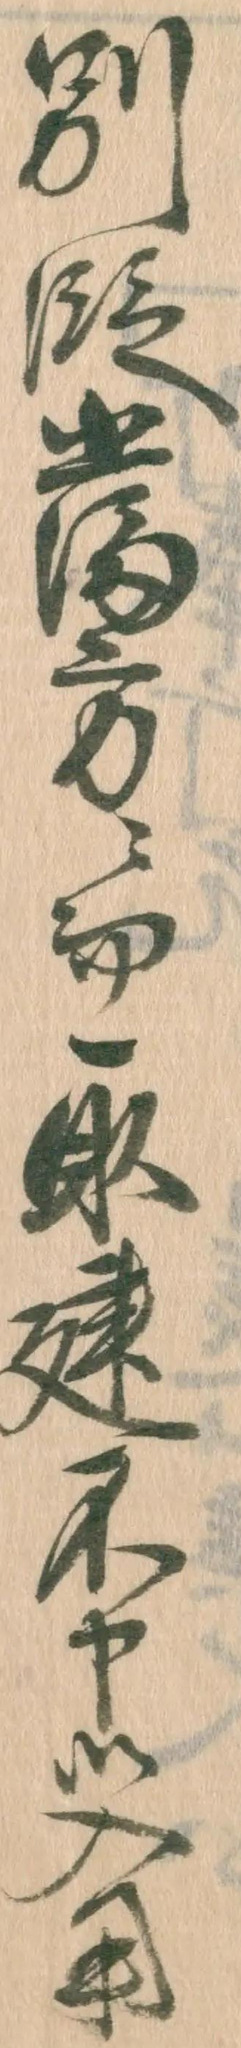別段当方ニて取建不申御入用
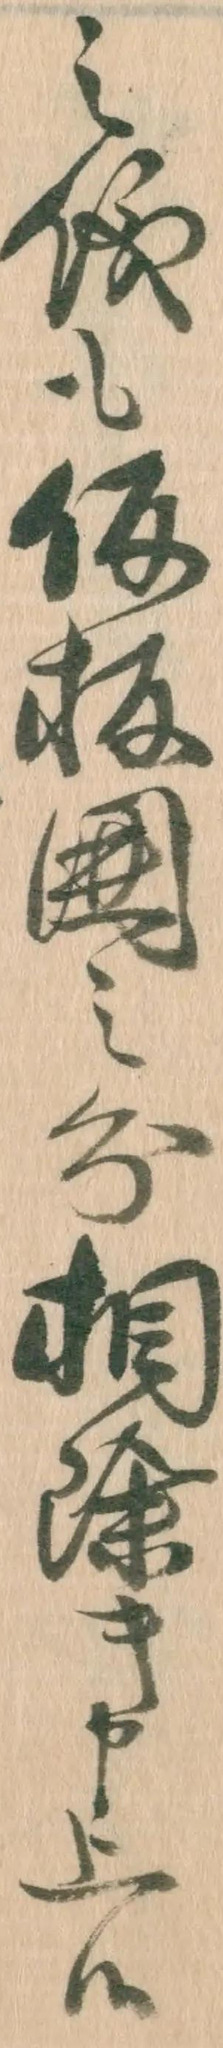之儀も仮板囲之分相除キ申上候
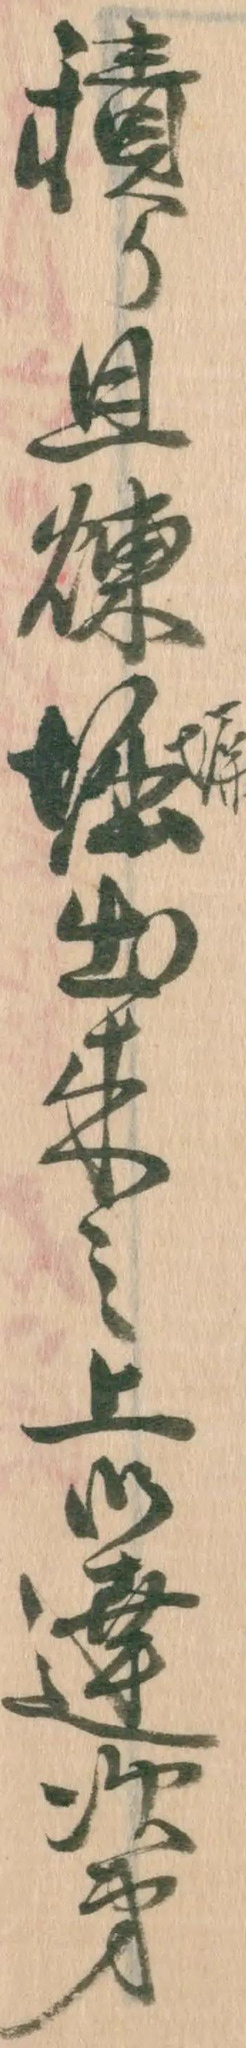積り且煉塀出来之上御達次第
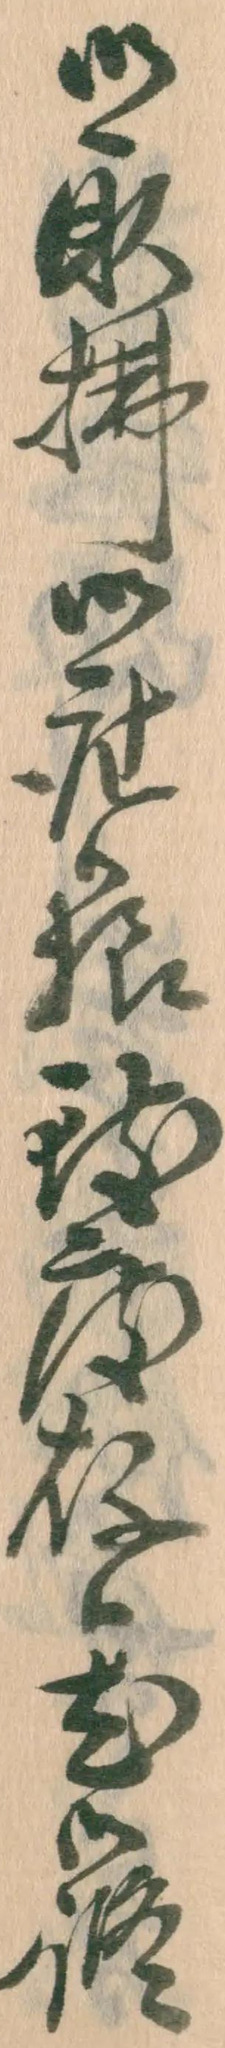御取払御座候様致度存候尤御修
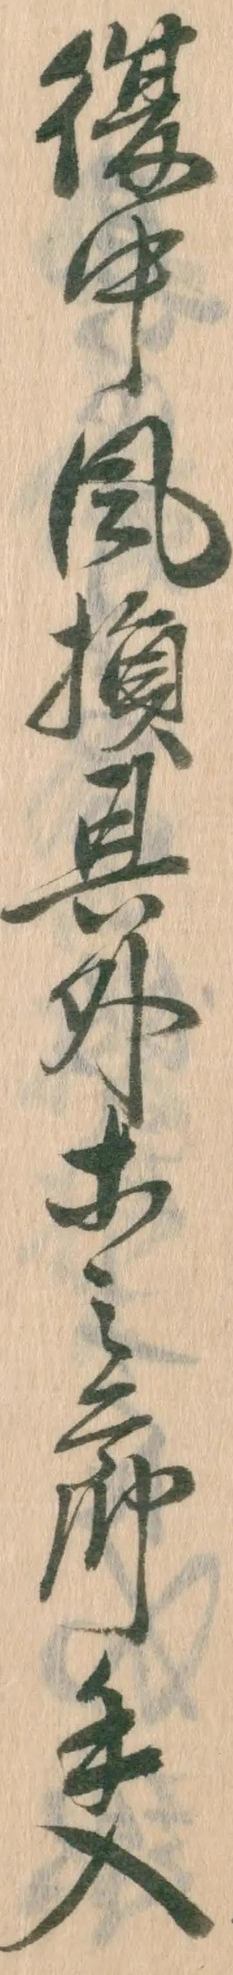復中風損其外等之節手入
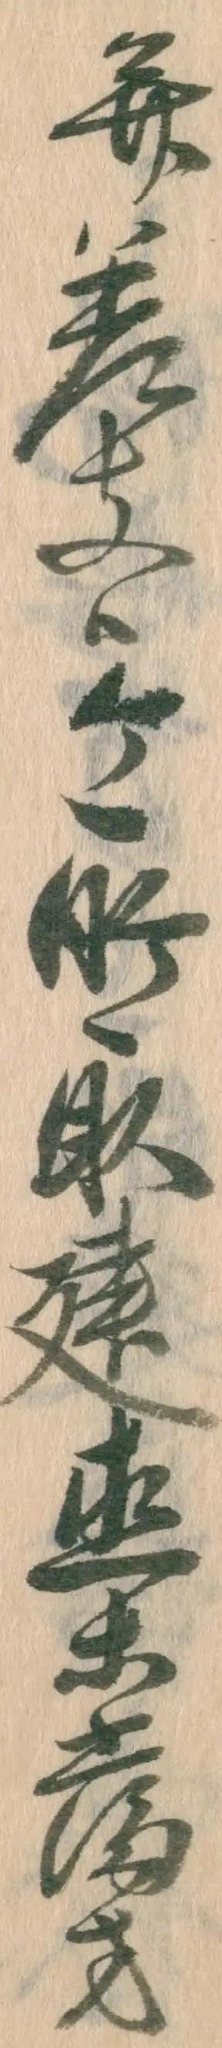幷差支候ケ所取建直等当方
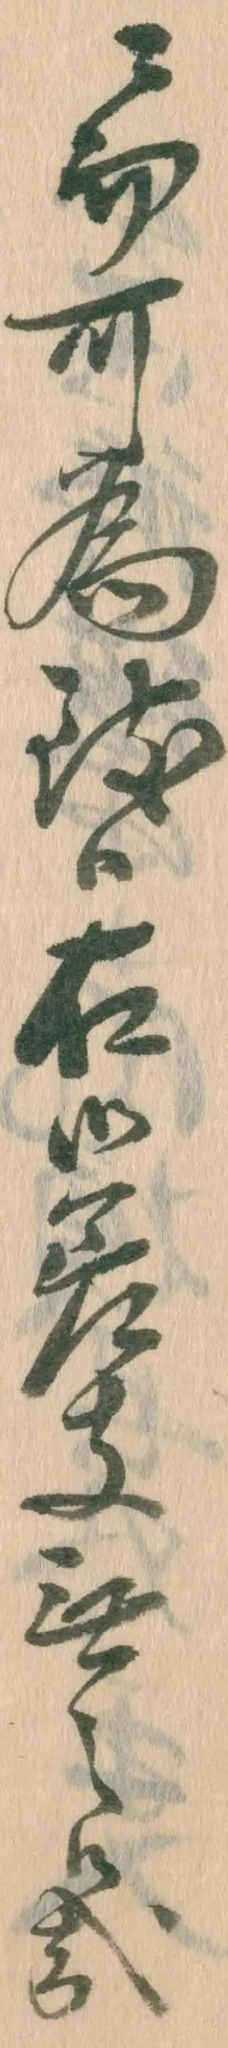ニて可為致候右御差支無之候哉
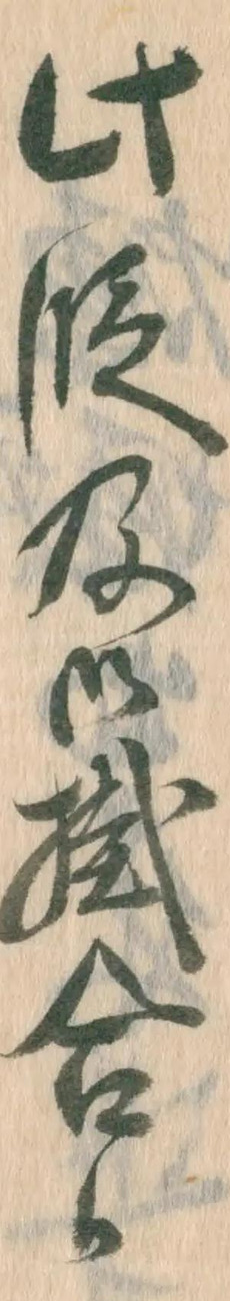此段及御掛合候
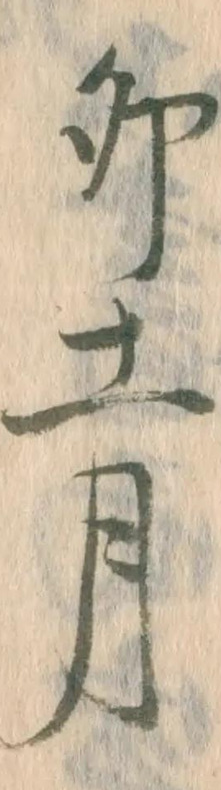卯十一月

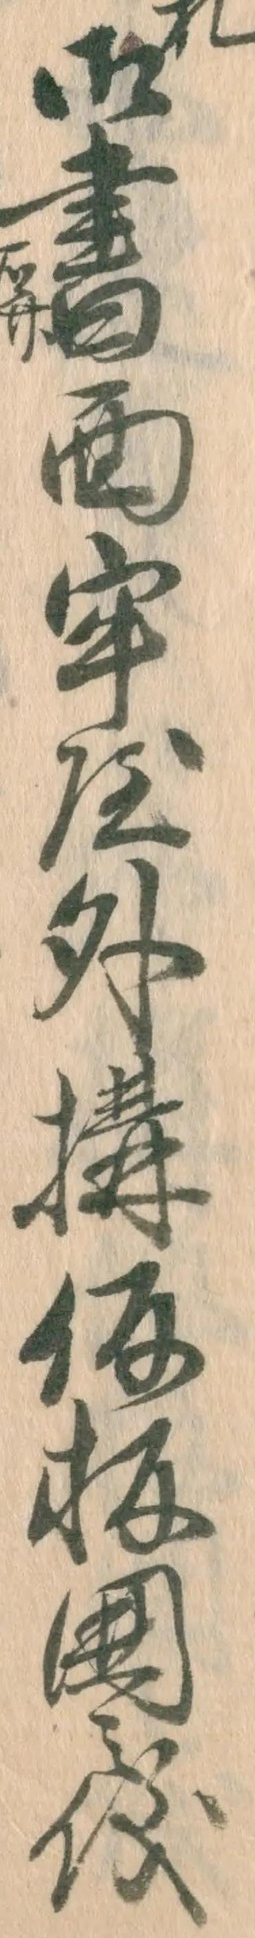御書面牢屋外構仮板囲之儀
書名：七十冊物類集 71巻. [44] 四十三 牢屋敷御普請御修覆地震ニ付骨折候牢屋掛御褒美之部
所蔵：国立国会図書館 National Diet Library, JAPAN
